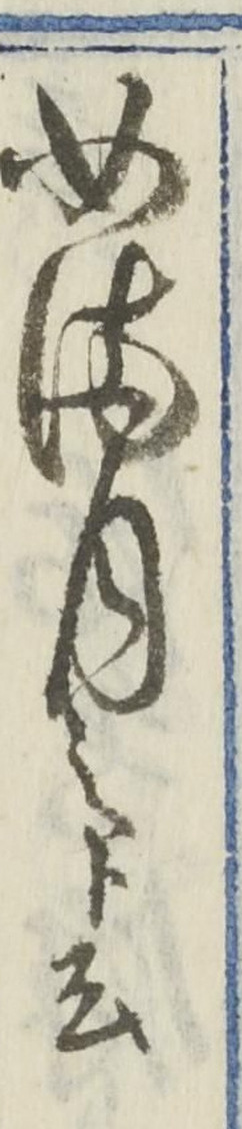如満月之ト云
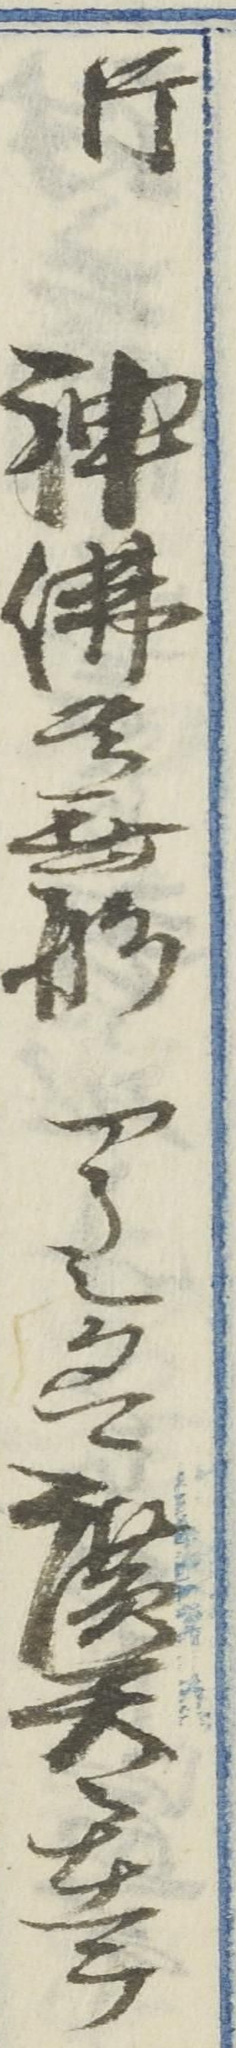片神仏は無形アラミタマ広天ニ在テ
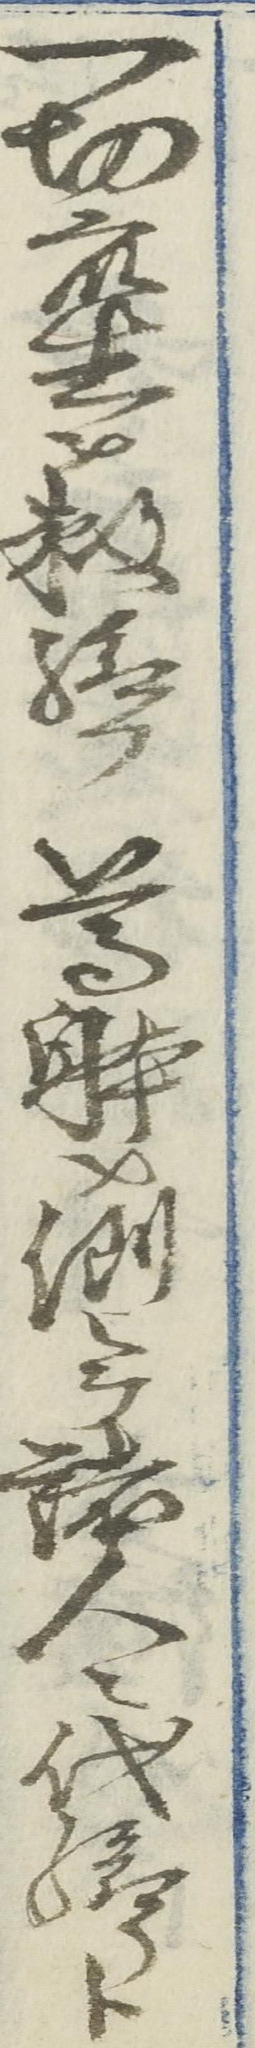一切衆生ヲ救給フ尊躰ヲ倒ニテ諸人ニ代給リト
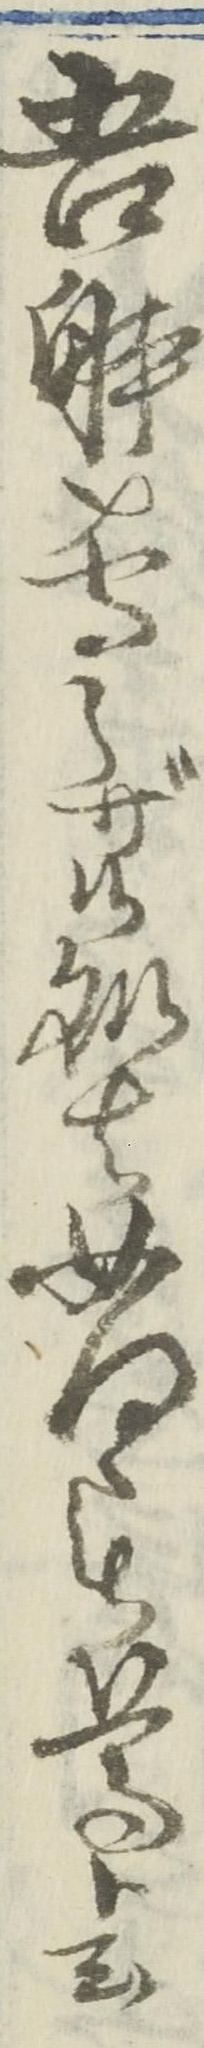吾躰ヲ守ラザル処は如何ニモ尊ト云
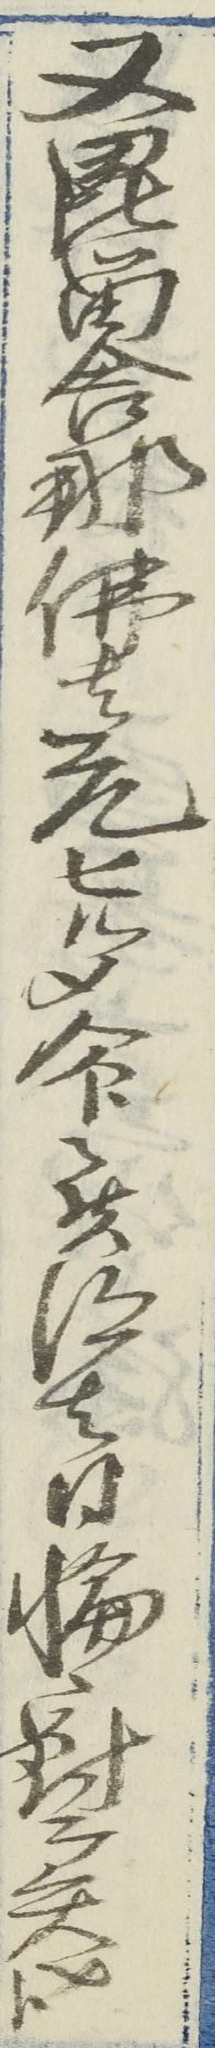又毘留舎那仏ハ老ヒタル命ニ候得者日輪之対テ矢ヲト
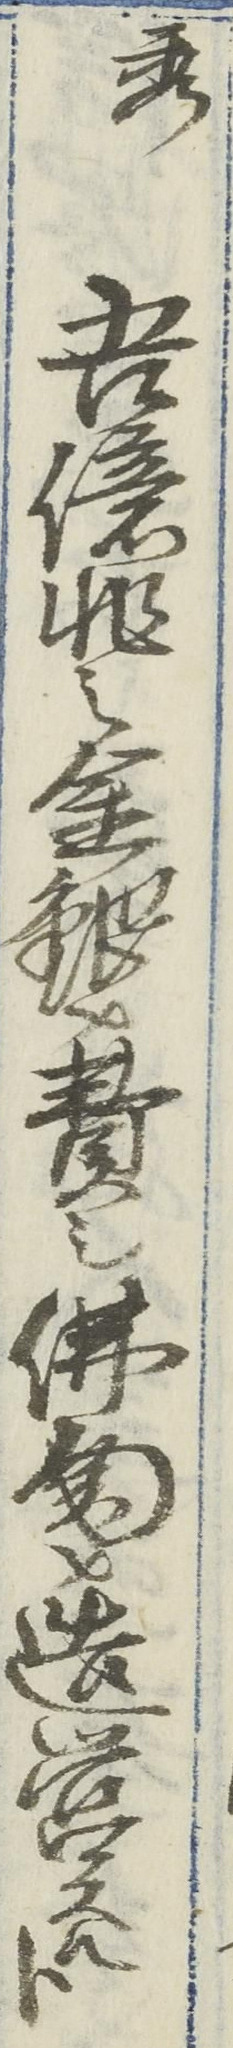秀吾億兆之金銀ヲ費シ仏殿ヲ造営スルト
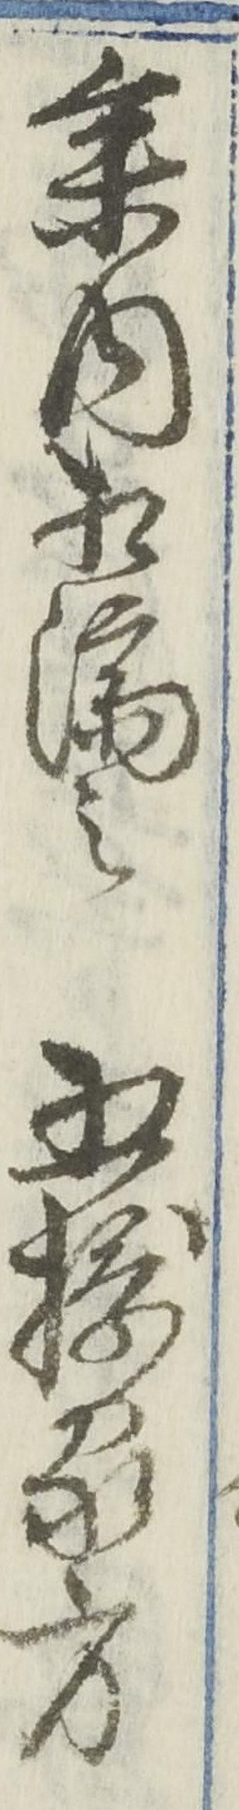参内相済之五摂家方
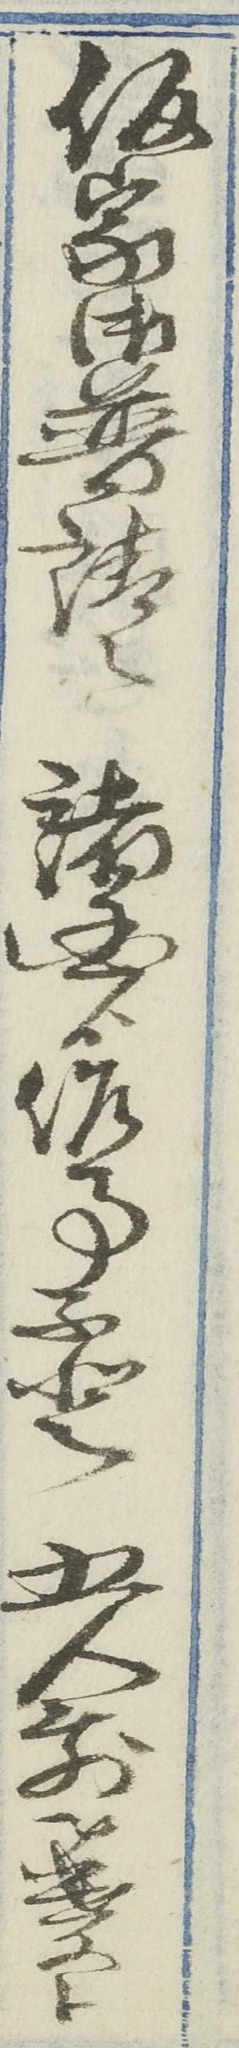仮家御普請之諸国ゟ作事不登五人前ヲ遣スト
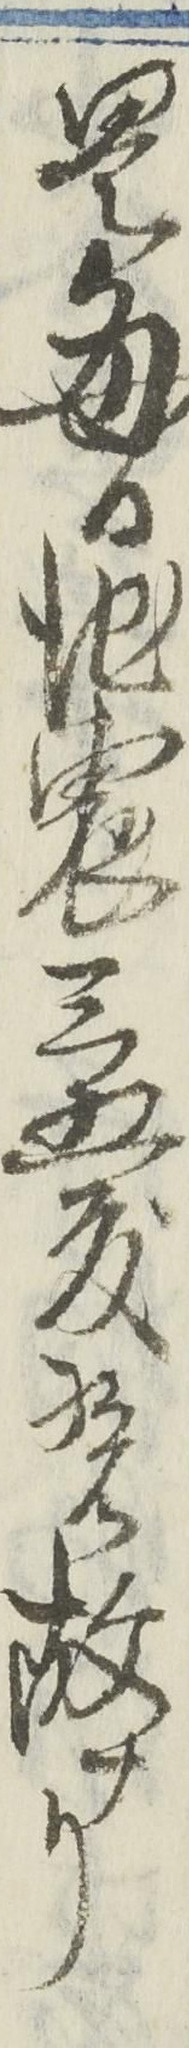是毎日地震三五度有ル故ナリ
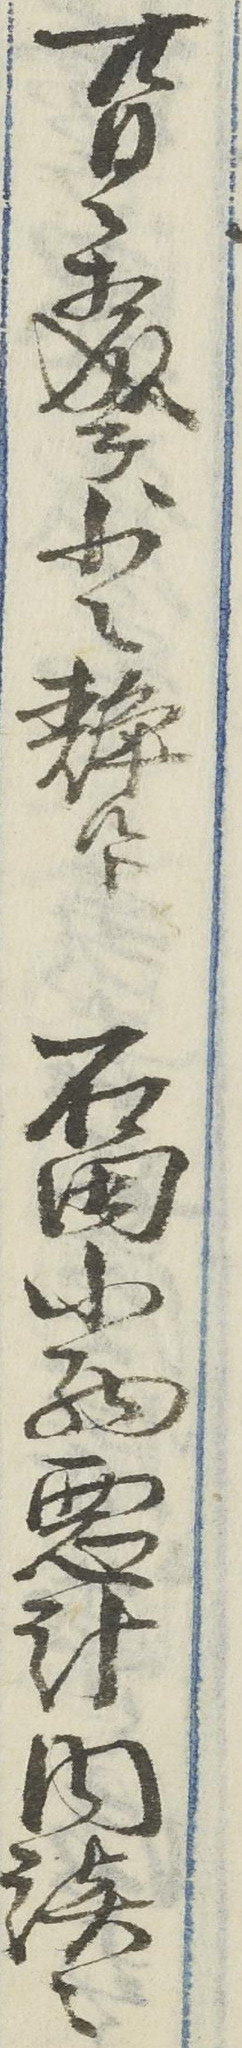廿日ニ相成テ少々静ルト石田小西悪計内談之
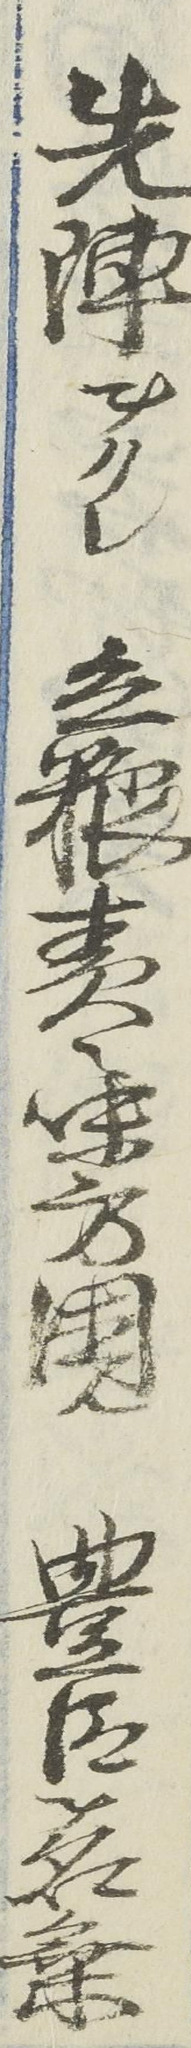先陣ヲクレ兵粮責之味方困ル豊臣ヲ名乗
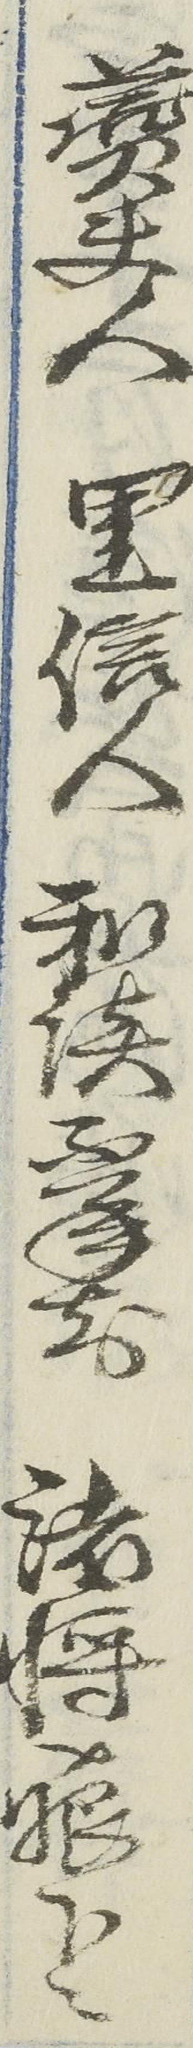燕夫人里信人和談不承知諸将ヲ眼下ニ
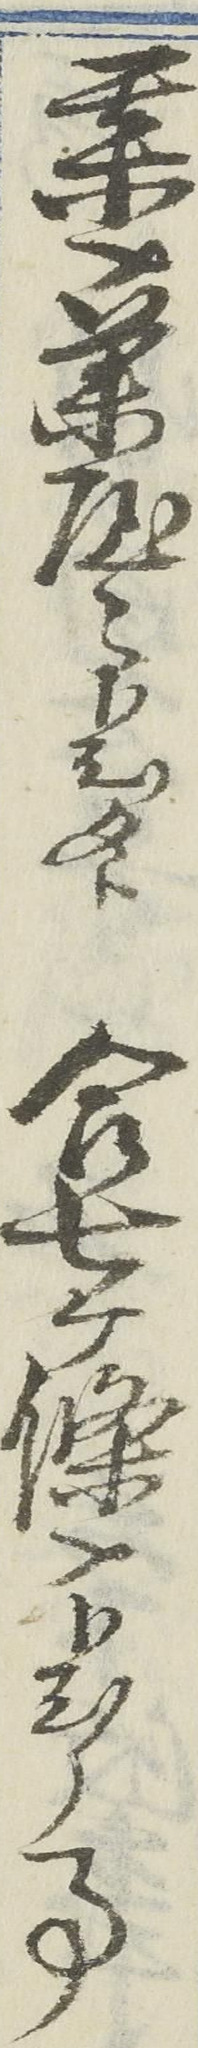某ヲ薬屋〻ト云タト合七ケ條ヲト云う事
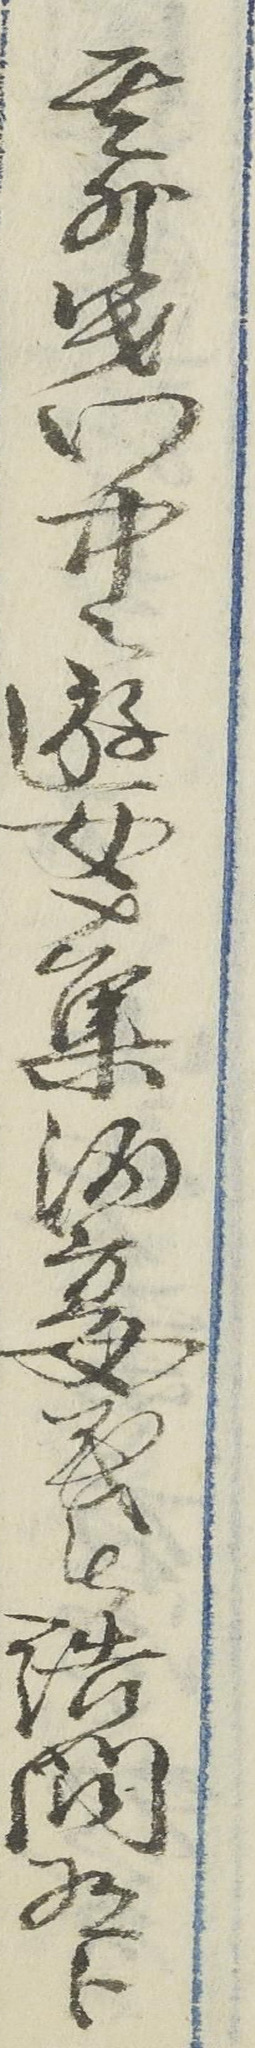石其外閉門中之遊女ヲ集酒宴義も詰問有ト

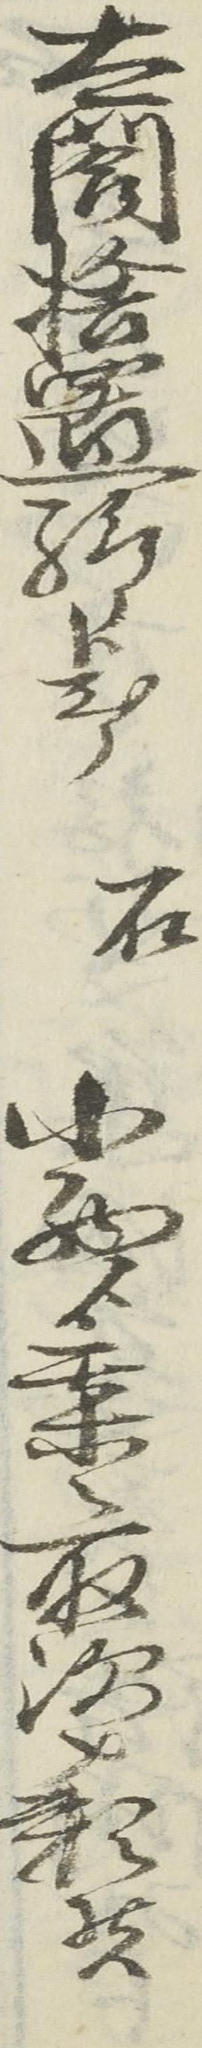太閤捨置給うト云う石小西ゟ某へ取次ヲ頼候
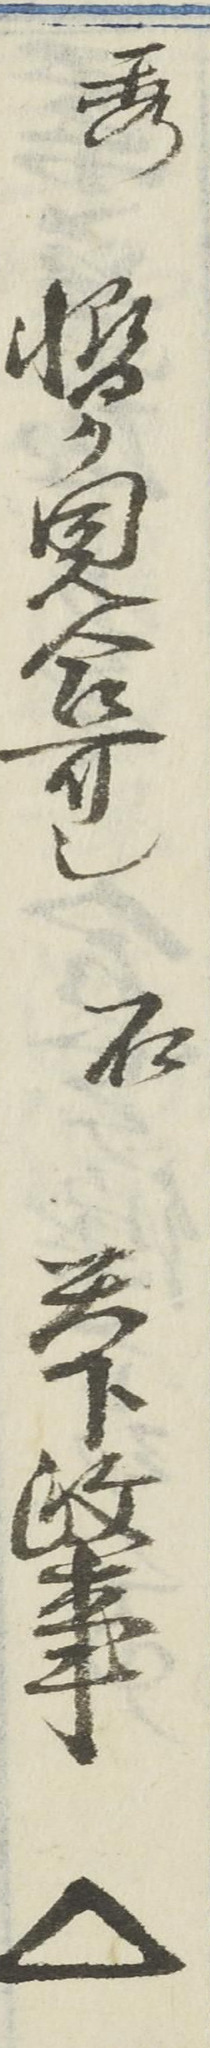秀暫ク美合可シ石天下政事△
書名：伏水大地震
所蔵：東京大学地震研究所図書室 Earthquake Research Institute Library, The University of Tokyo, JAPAN
